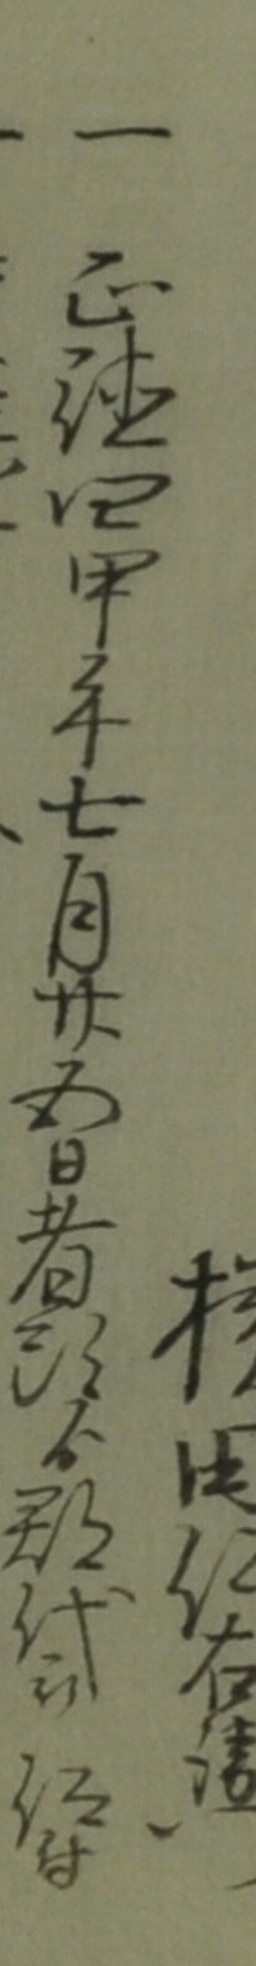一正徳四甲午七月廿五日者頭ゟ郡代被仰付
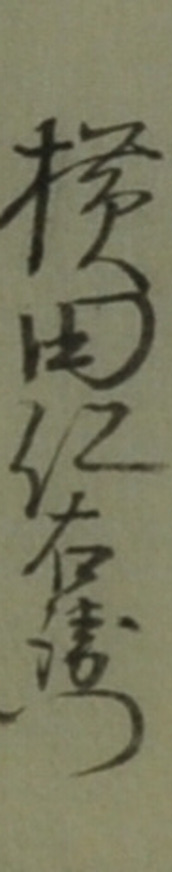横田仁右衛門
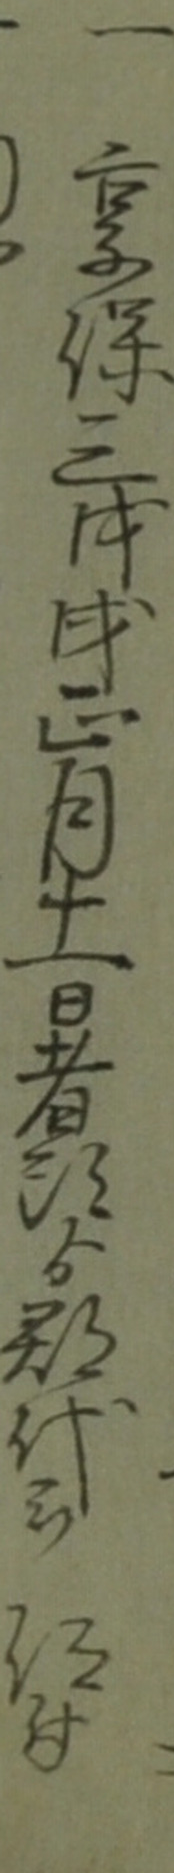一享保三戊戌正月十一日者頭ゟ郡代被仰付
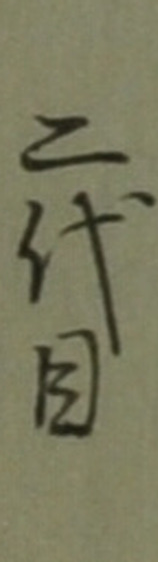二代目
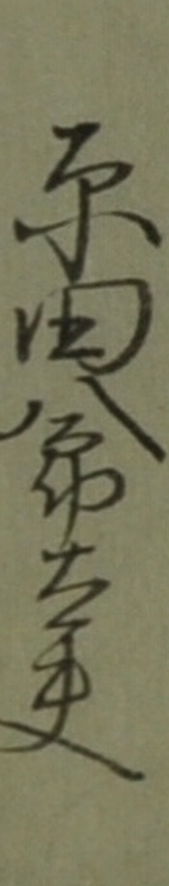原田八郎太夫
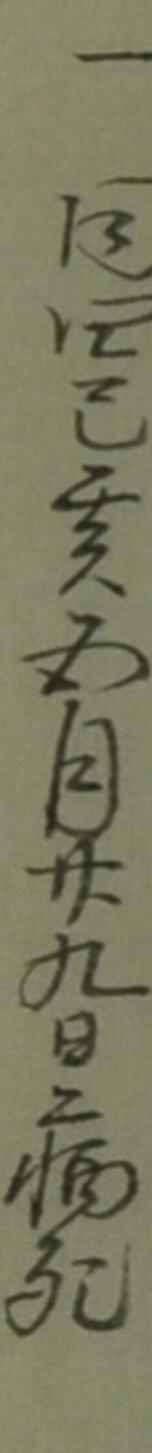一同四己亥五月廿九日病死
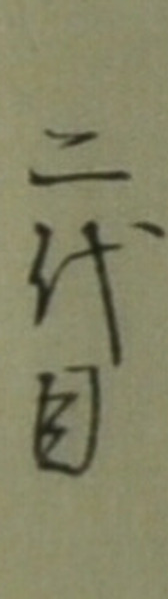二代目

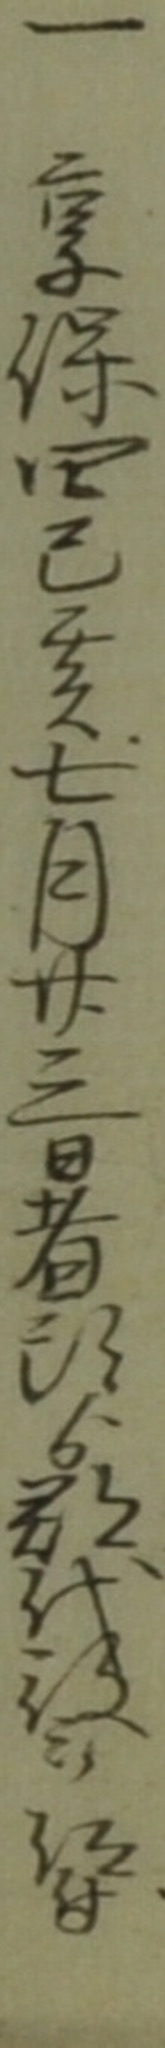一享保四己亥七月廿三日者頭ゟ郡代代役被仰付
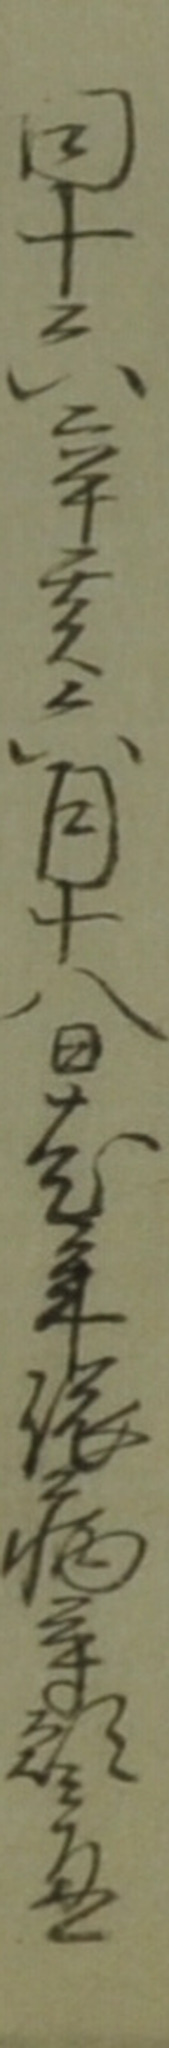一同十六辛亥六月十八日老年依病気願之通
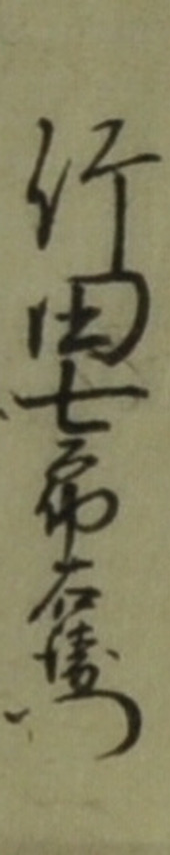竹田七郎右衛門
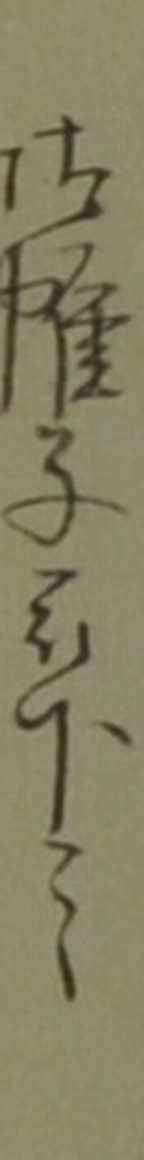御帷子被下之
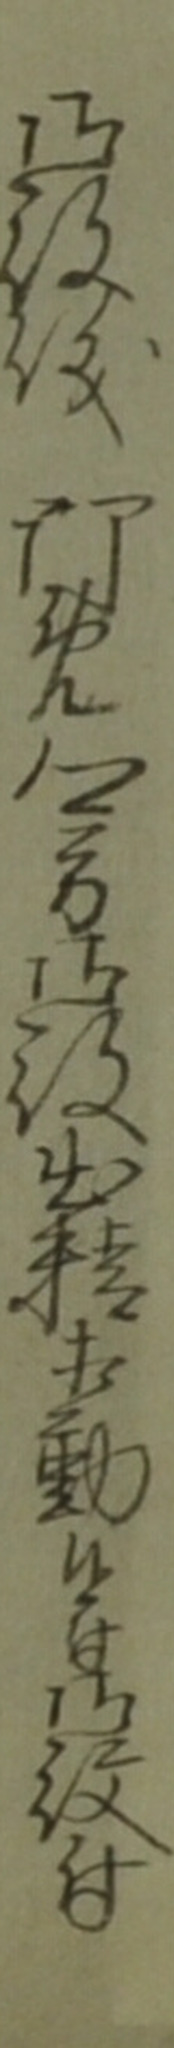御役儀御免郷方御役出精相勤候付御紋付
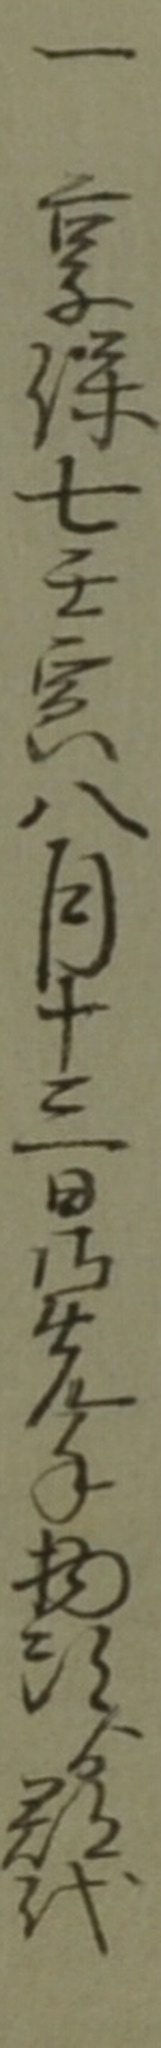一享保七壬寅八月十三日御先手物頭ゟ郡代
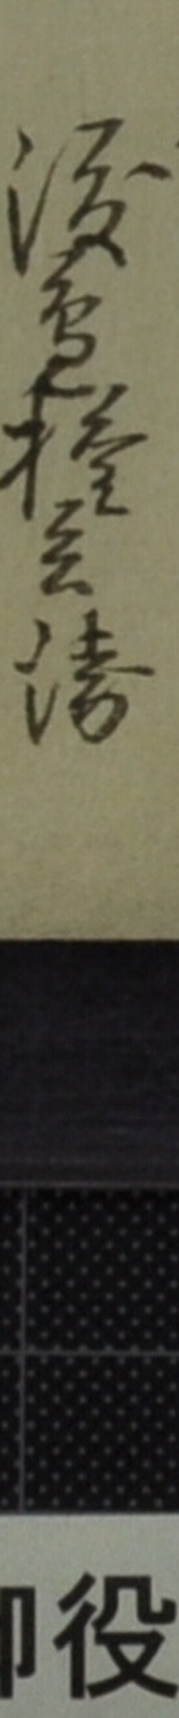渡辺権兵衛
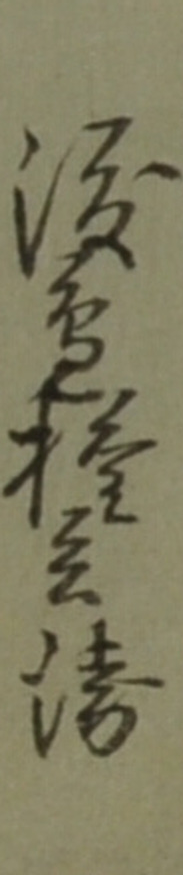渡辺権兵衛
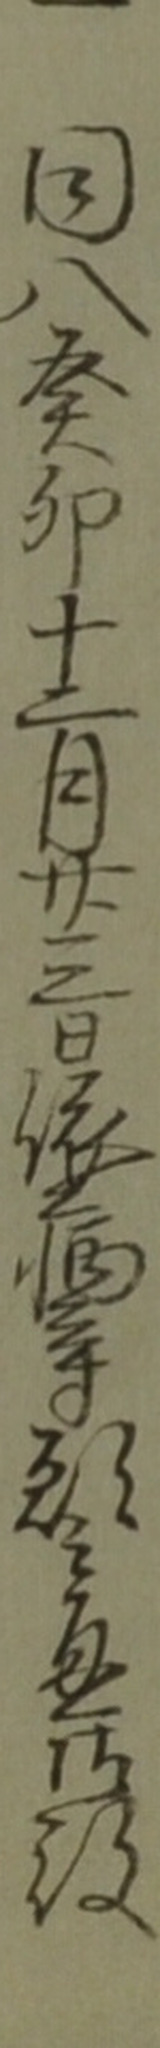一同八癸卯十二月廿三日依病気願之通御役
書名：諸御役代々録（二）
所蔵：伊那市立高遠町図書館・合同会社AMANE
